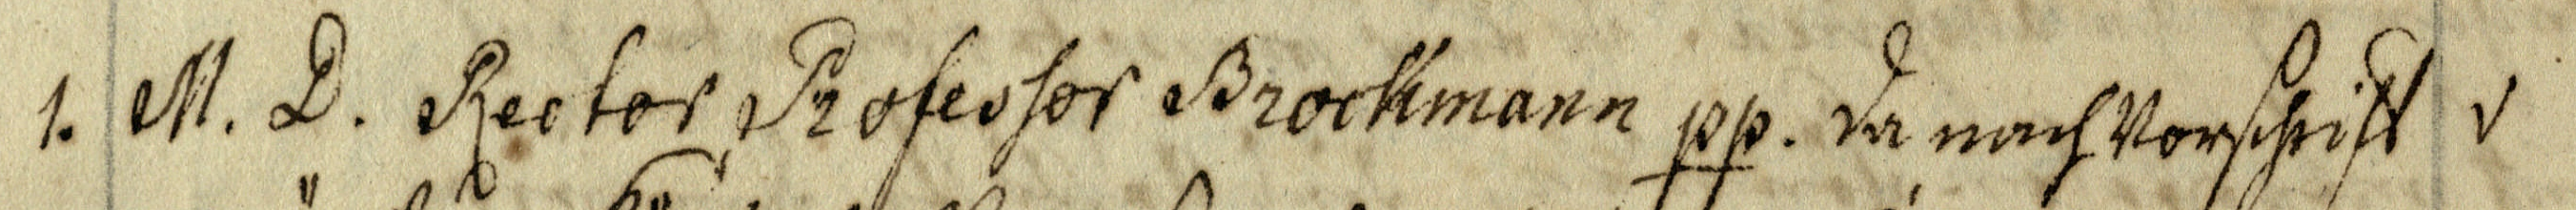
1. M. D. Rector Professor Brockmann pp. Da nach Vorschrift
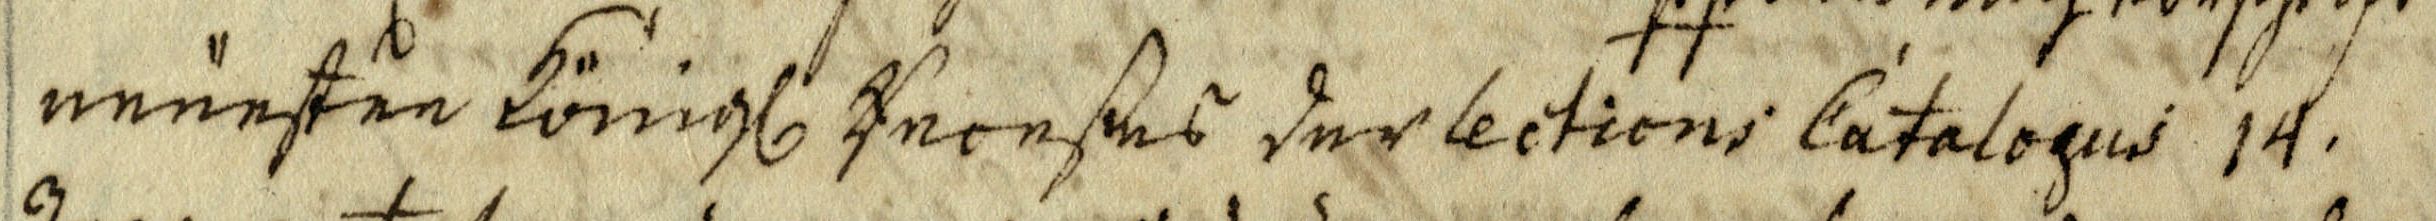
neuesten Königl. Receßes der Lections Catalogus 14.
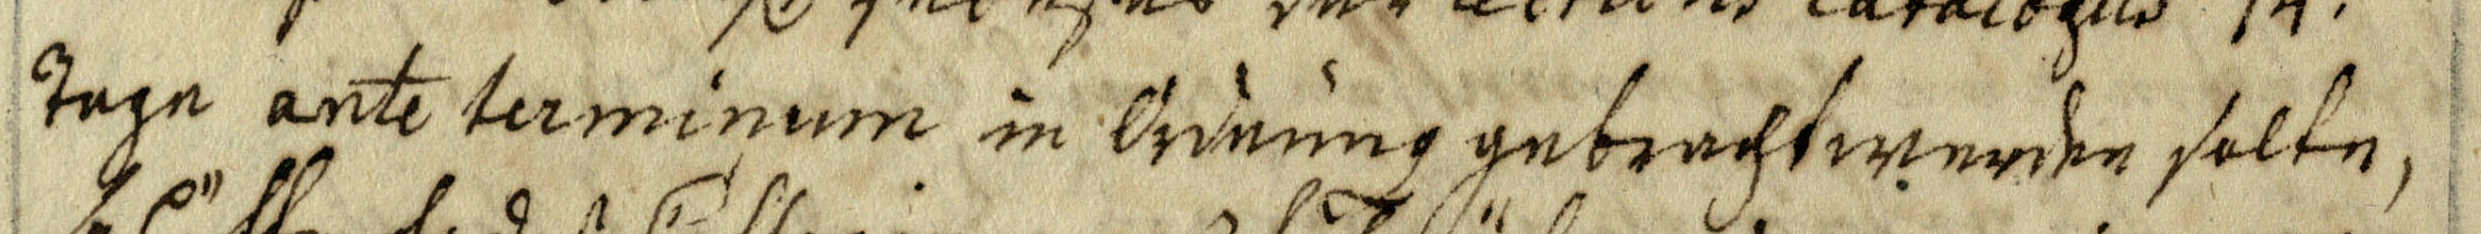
Tage ante terminum in Ordnung gebracht werden solte,
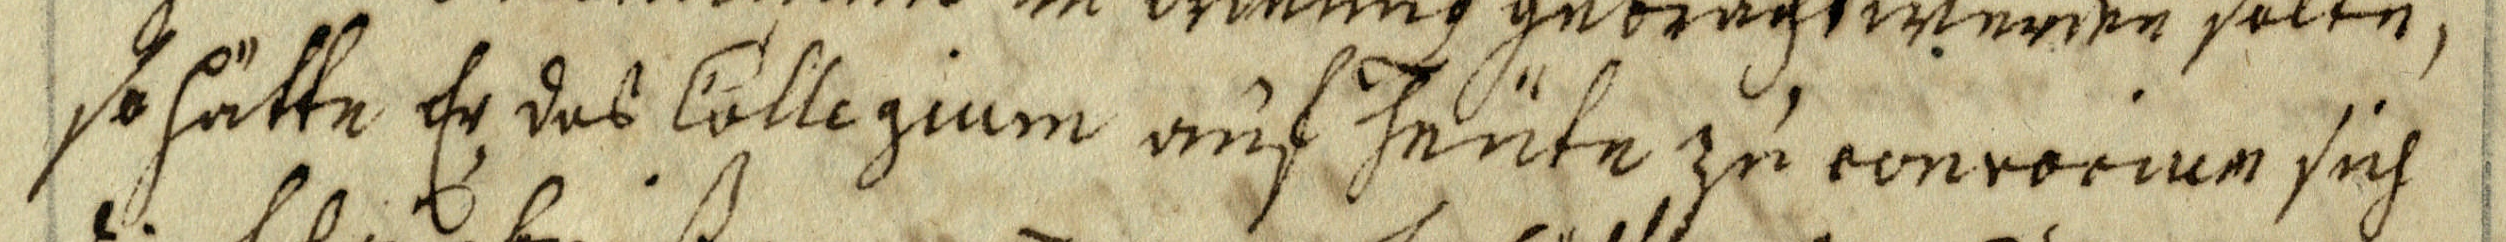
so hätte Er das Collegium auf heute zu convocium sich
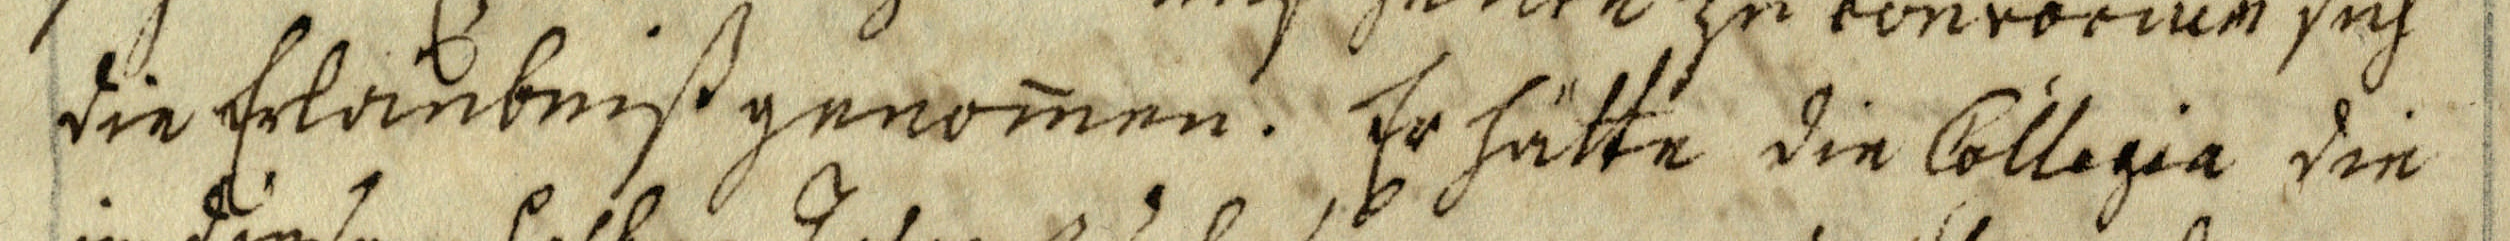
die Erlaubniß genomen. Er hätte die Collegia die
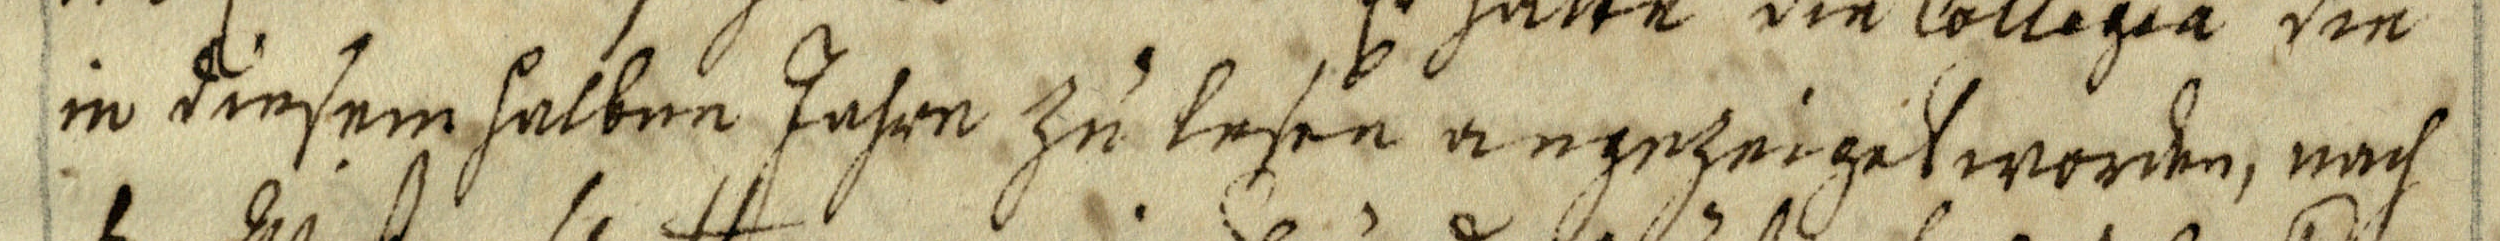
in diesem halben Jahre zu lesen angezeiget worden, nach
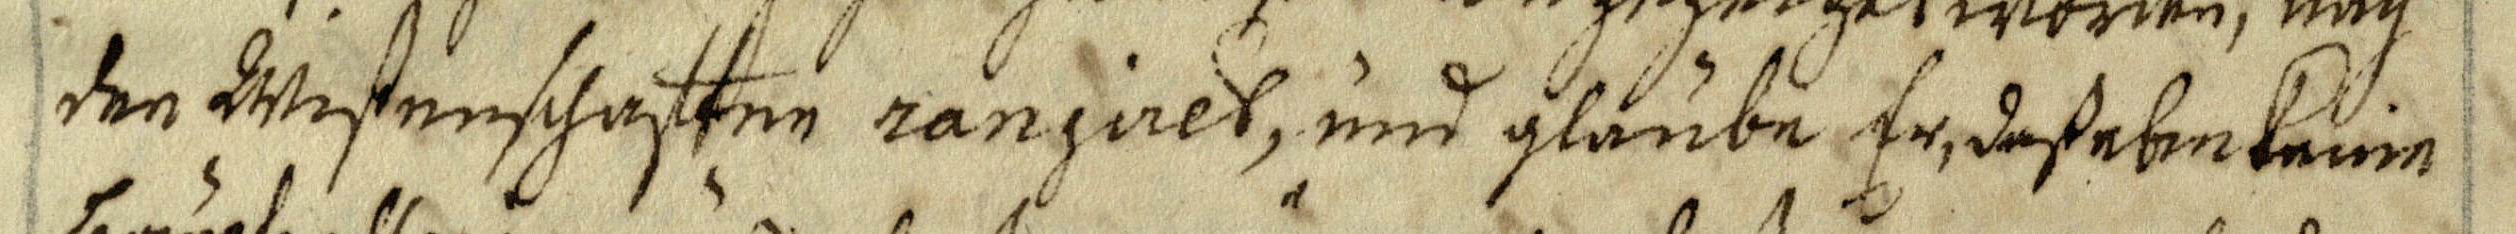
den Wissenschaften rangiret, und glaube Er, daß eben keine
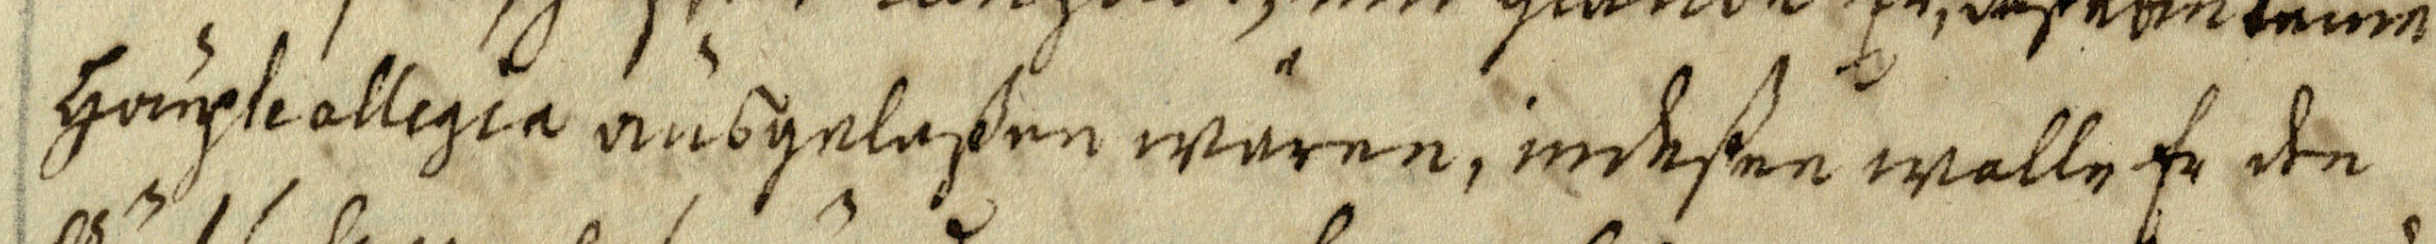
Hauptcollegia ausgelaßen wären, indeßen wolle Er den
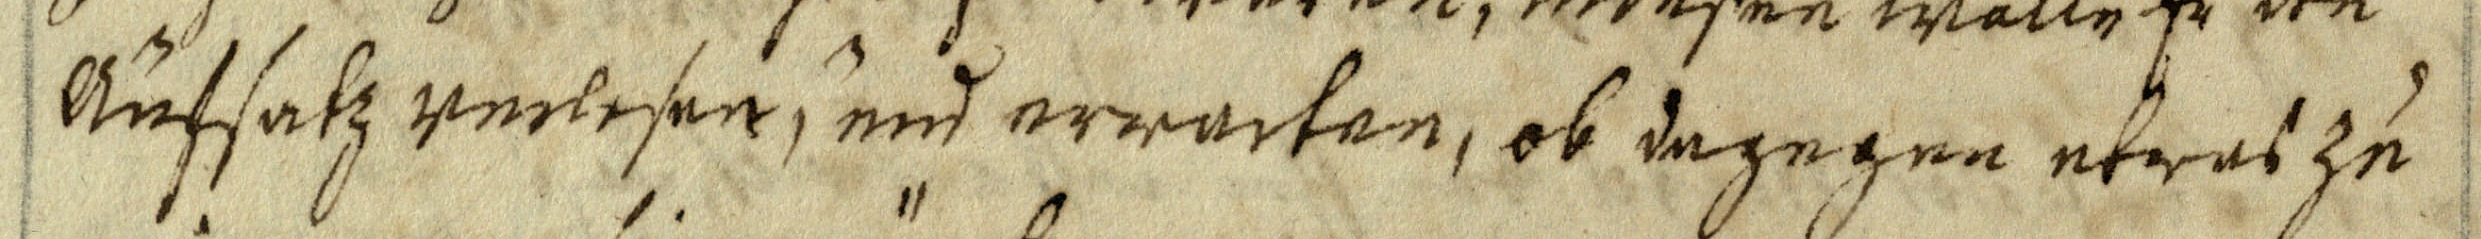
Aufsatz verlesen, und erwarten, ob dagegen etwas zu
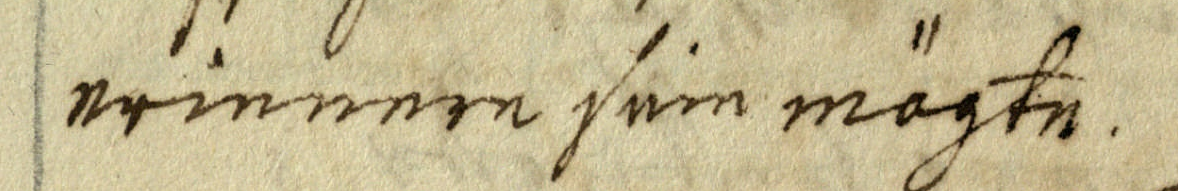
erinnern sein mögte.
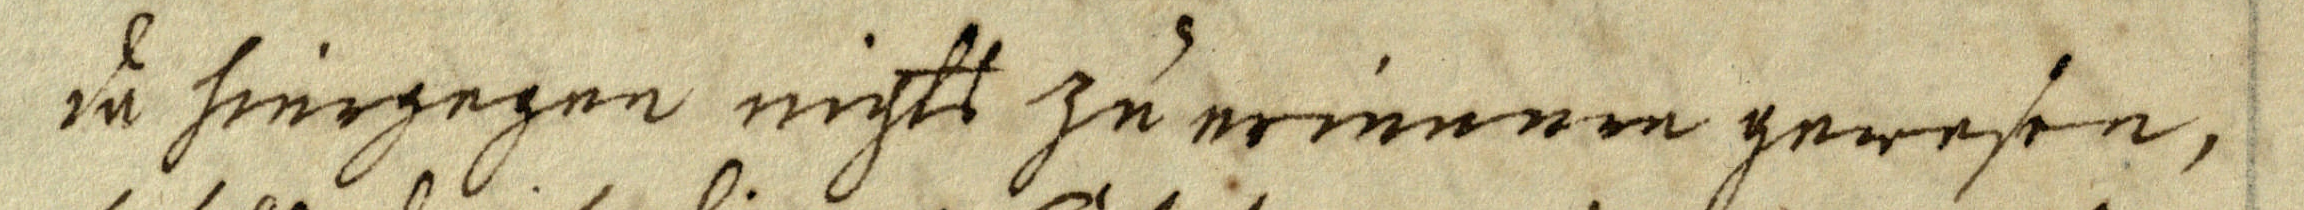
Da hiergegen nichts zu erinnern gewesen,
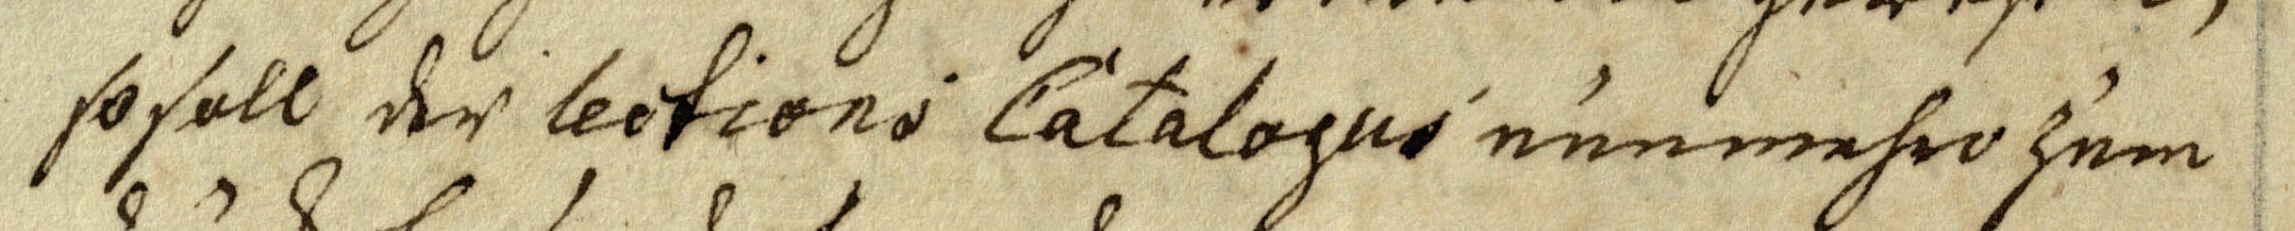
so soll der lections Catalogus nunmehro zum
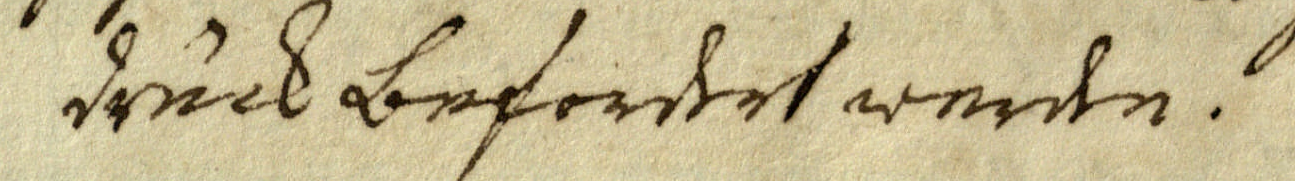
Druck befordert werden.
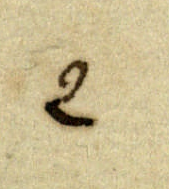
2
